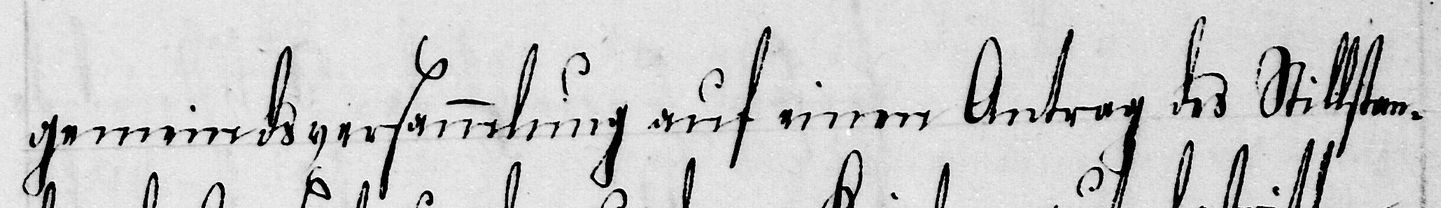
gemeindsversammlung auf einen Antrag des Stillst¬
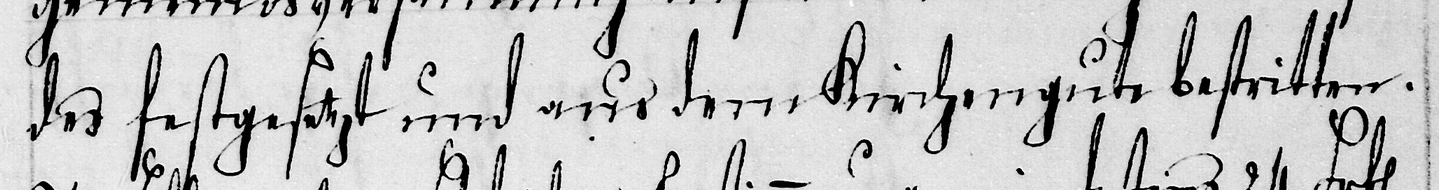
des festgesetzt und aus dem Kirchengute bestritten.
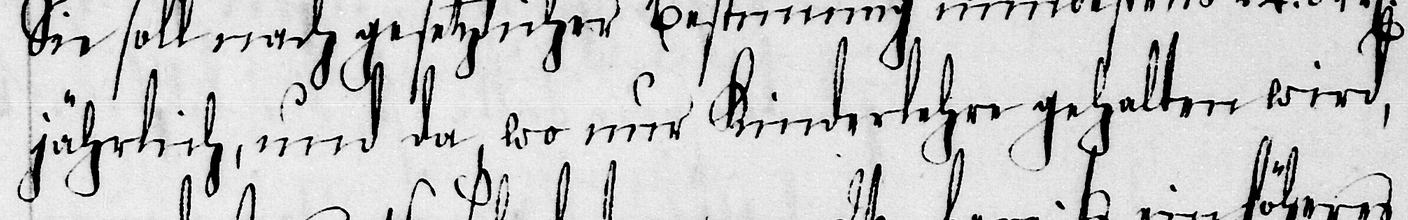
jährlich, und da, wo nur Kinderlehre gehalten wird,
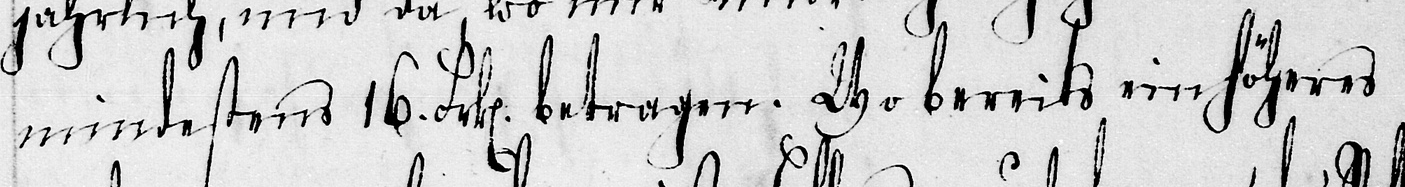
mindestens 16. Frk[en]. betragen. Wo bereits ein höheres
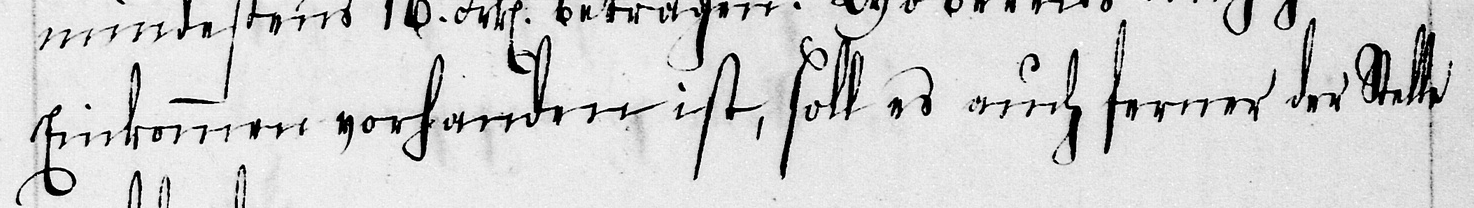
Einkommen vorhanden ist, soll es auch ferner der Stel¬
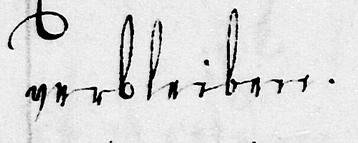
verbleiben.
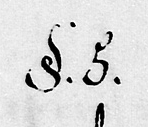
§. 5.
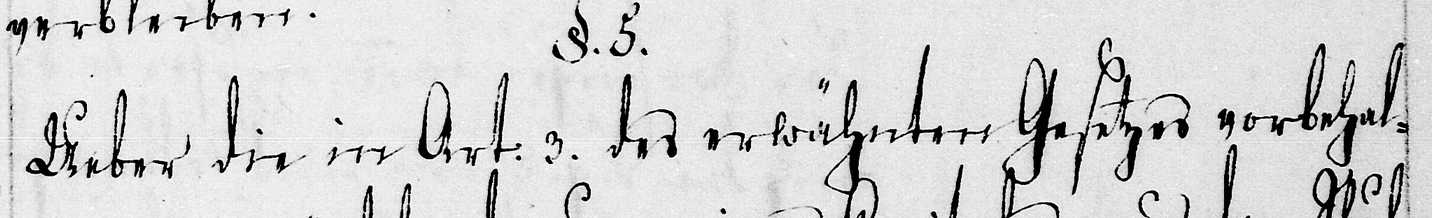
Ueber die in Art: 3 des erwähnten Gesetzes, vorbehal¬
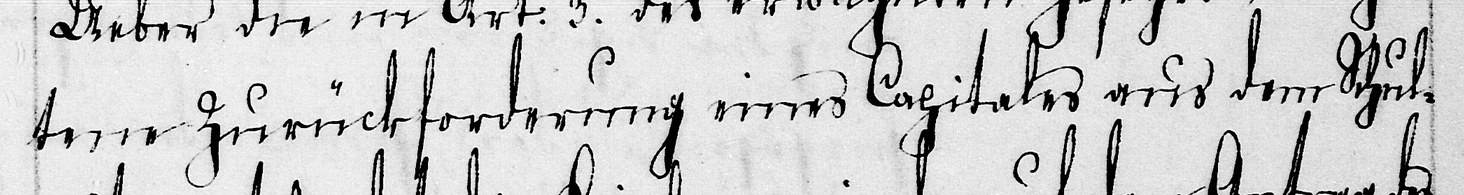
tene Zurückforderung eines Capitales aus dem Schul¬
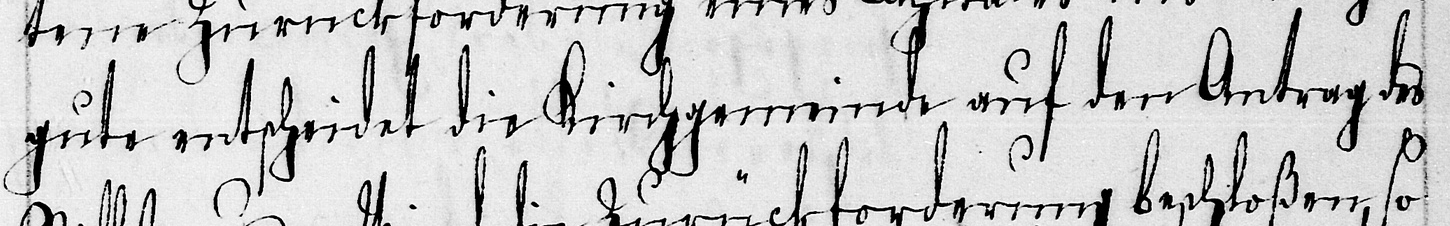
gute entscheidet die Kirchgemeinde auf den Antrag des
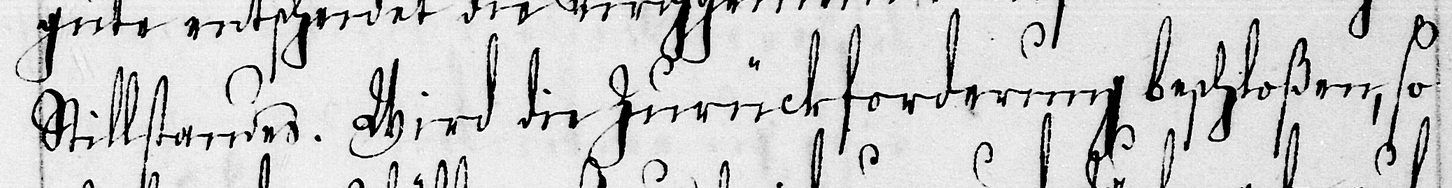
Stillstandes. Wird die Zurückforderung beschloßen, so
